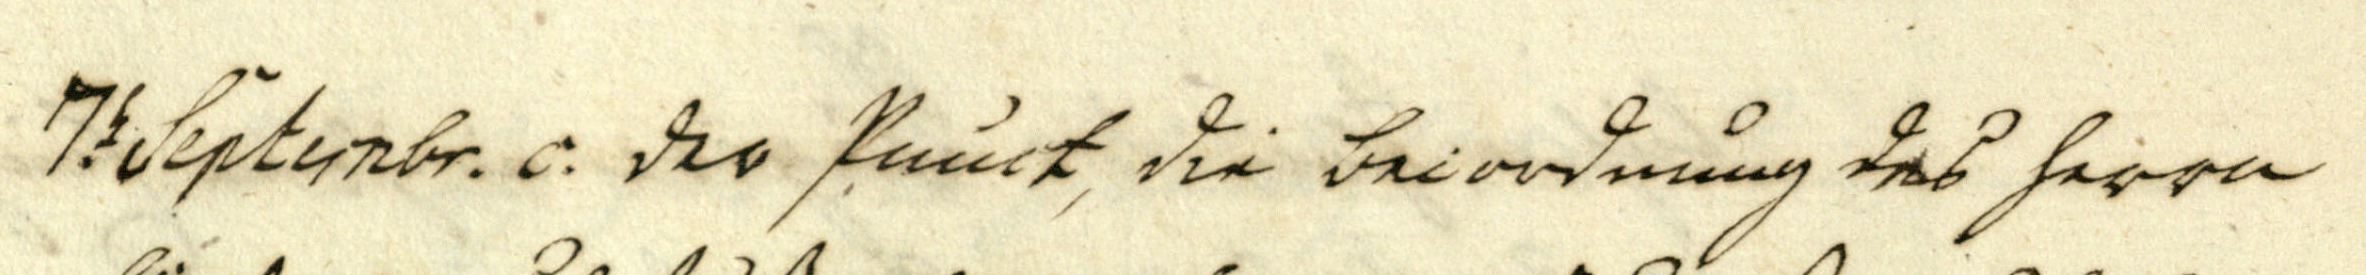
7. Septembr. c. der Punct, die Beiordnung, des Herrn
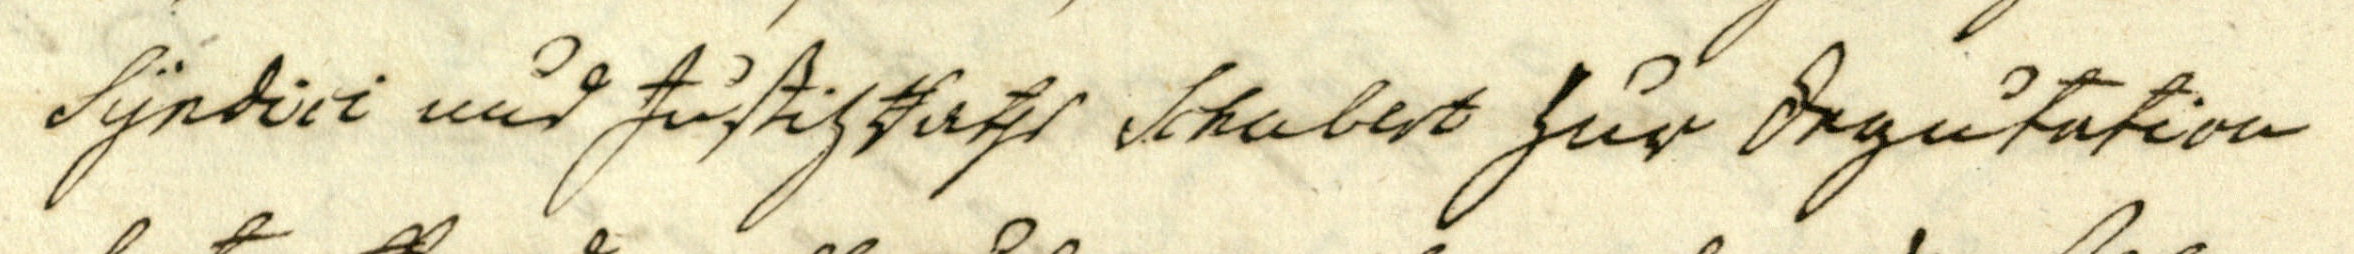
Sÿndici und Justizsraths Schubert zur Deputation
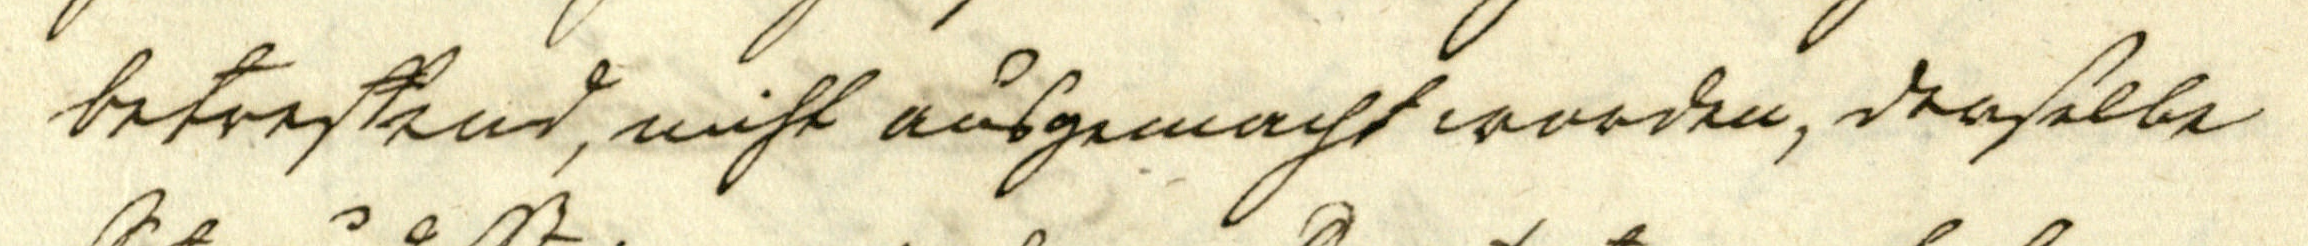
betreffend, nicht ausgemacht worden, derselbe
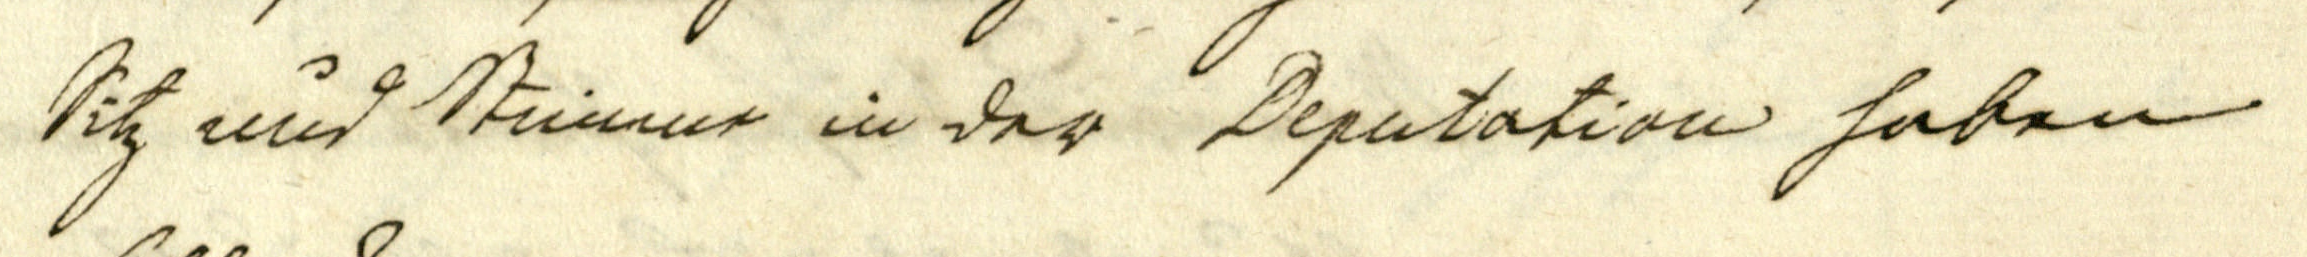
Sitz und Stimme in der Deputation haben
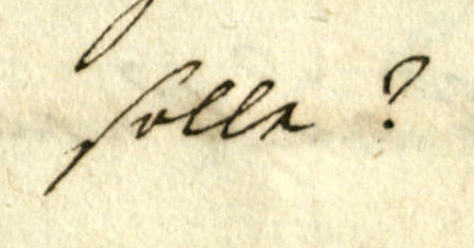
solle ?
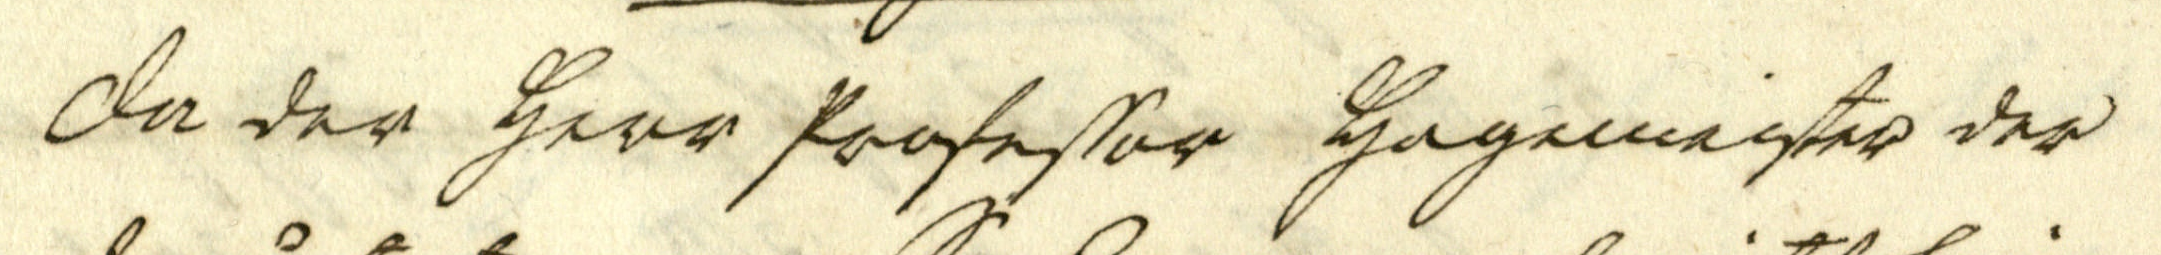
Da der Herr Professor Hagemeister der
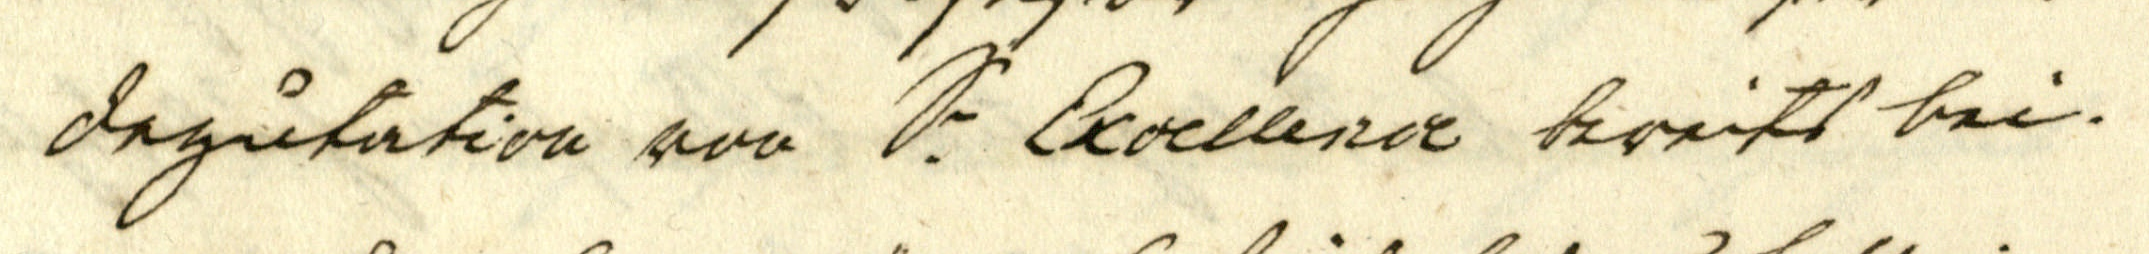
Deputation von Sr. Excellence bereits bei
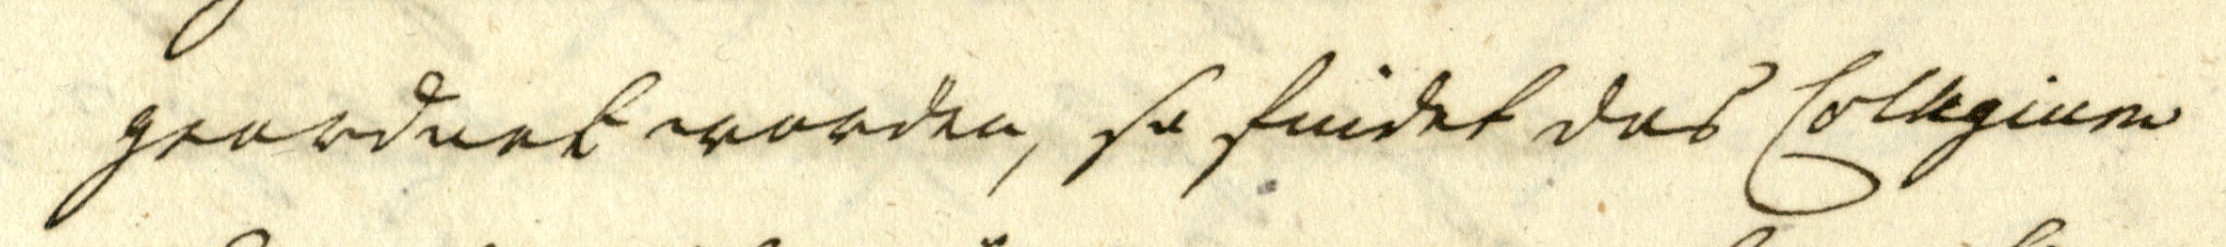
geordnet worden, so findet das Collegium
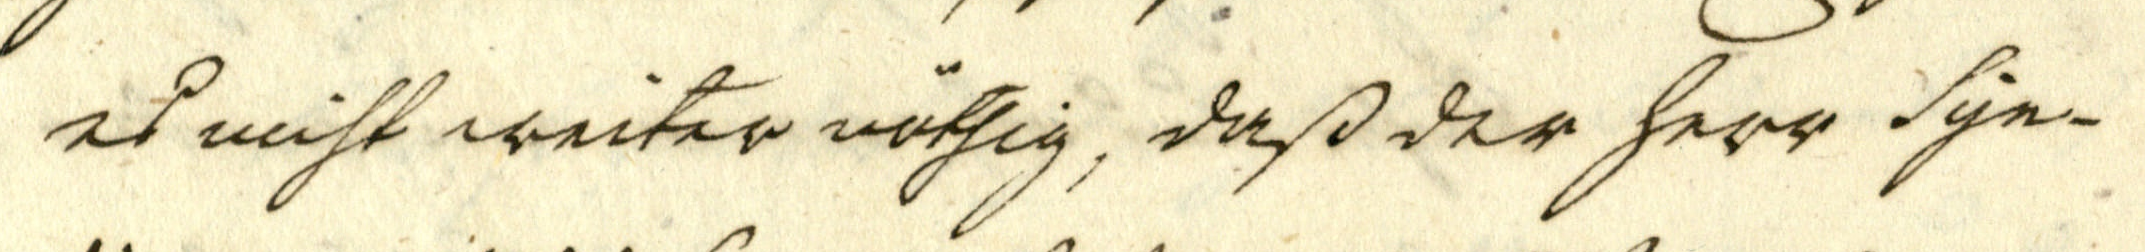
es nicht weiter nöthig, daß der Herr Sÿn¬
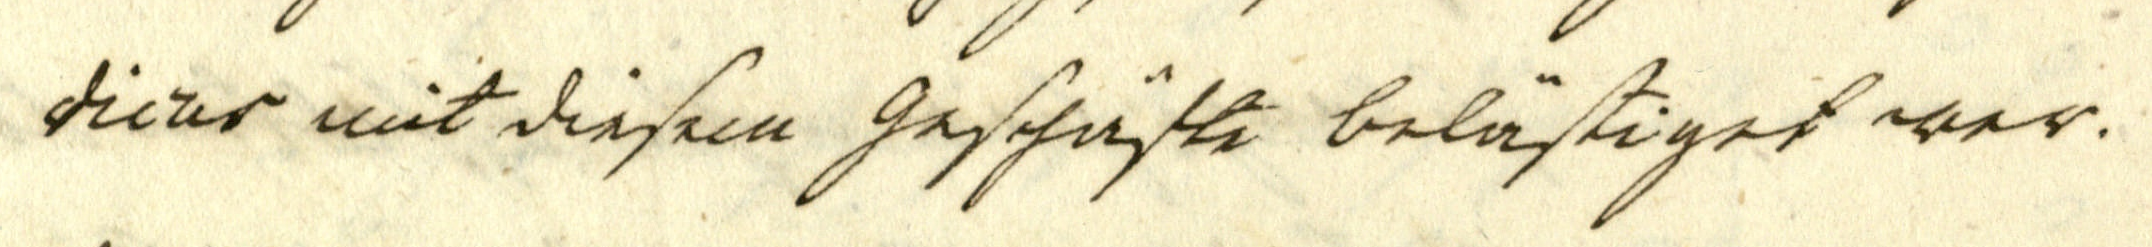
dicus mit diesem Geschäfte belästiget wer¬
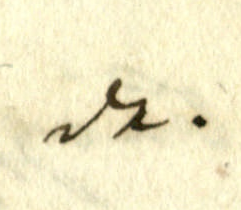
de.
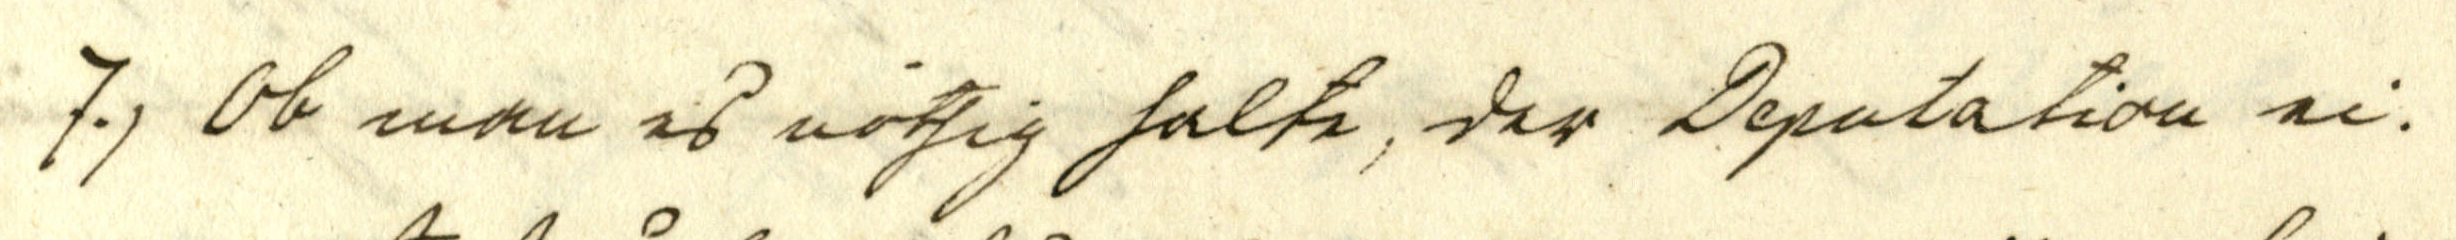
7., Ob man es nöthig halte, der Deputation ei¬
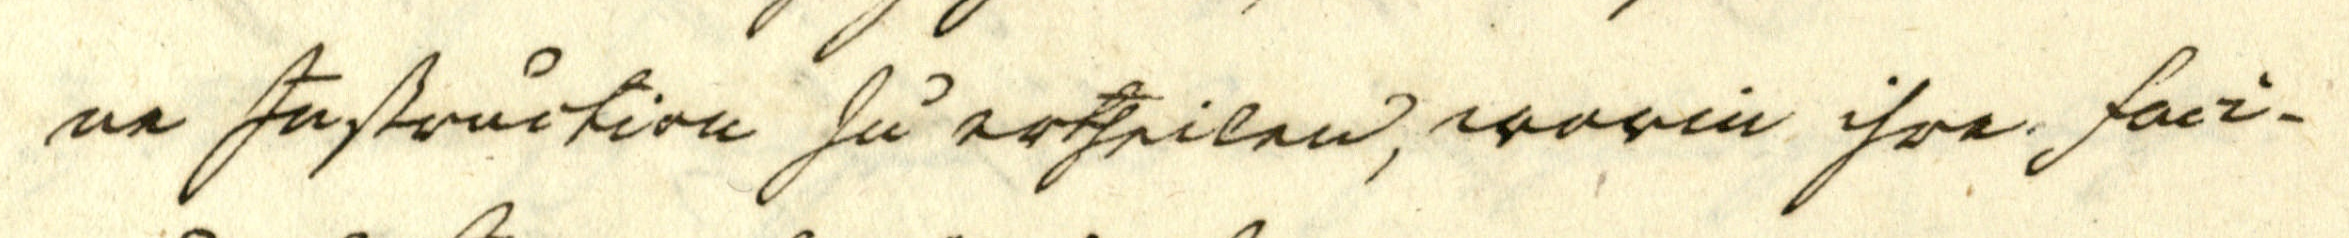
ne Instruction zu ertheilen, worin ihre Faci¬
